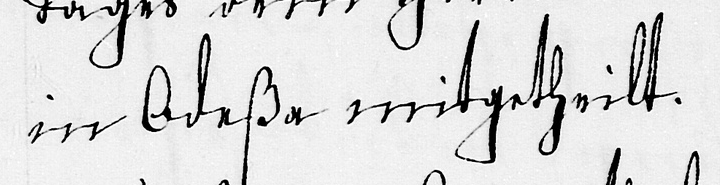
in Odeßa mitgetheilt.
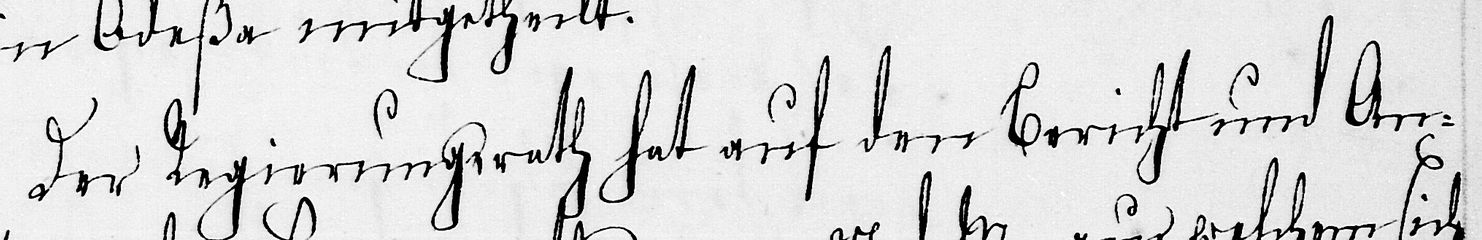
Der Regierungsrath hat auf den Bericht und Ant¬
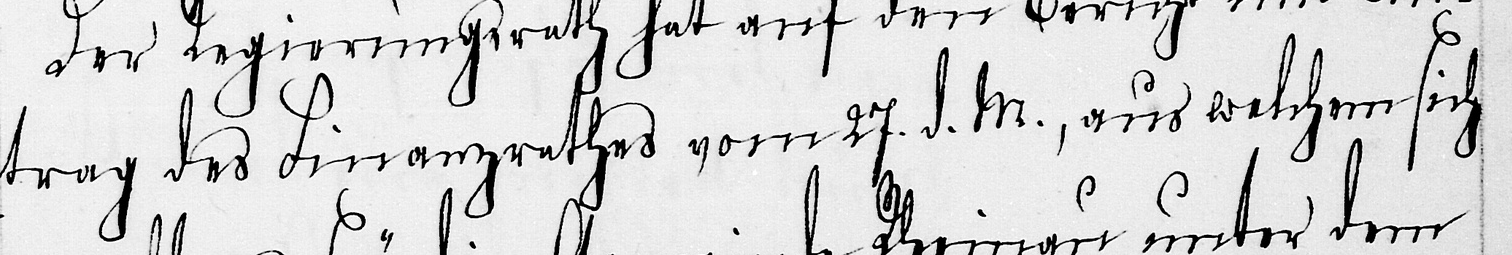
rag des Finanzrathes vom 27. d. M., aus welchem sich
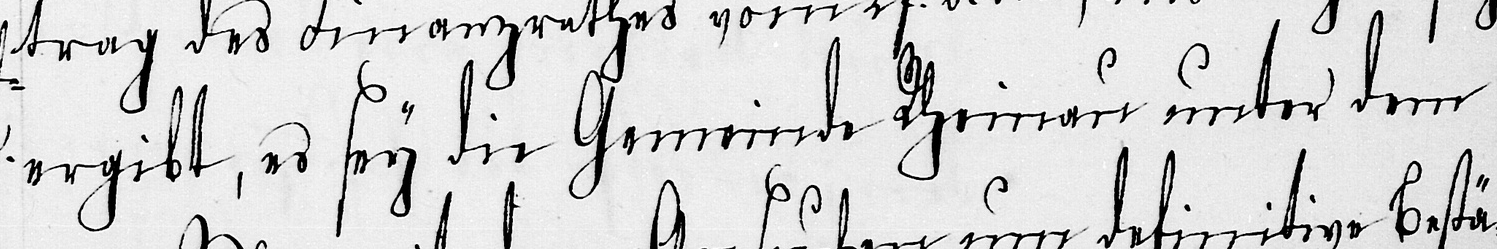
ergibt, es sey die Gemeinde Rheinau unter dem
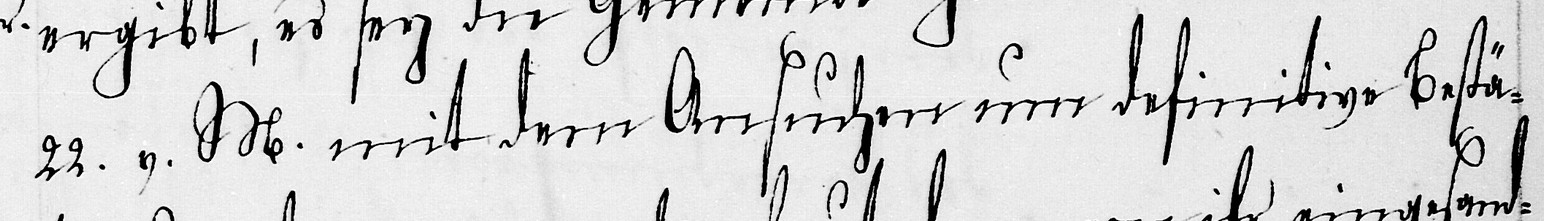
22. v. M. mit dem Ansuchen um definitive Bestä¬
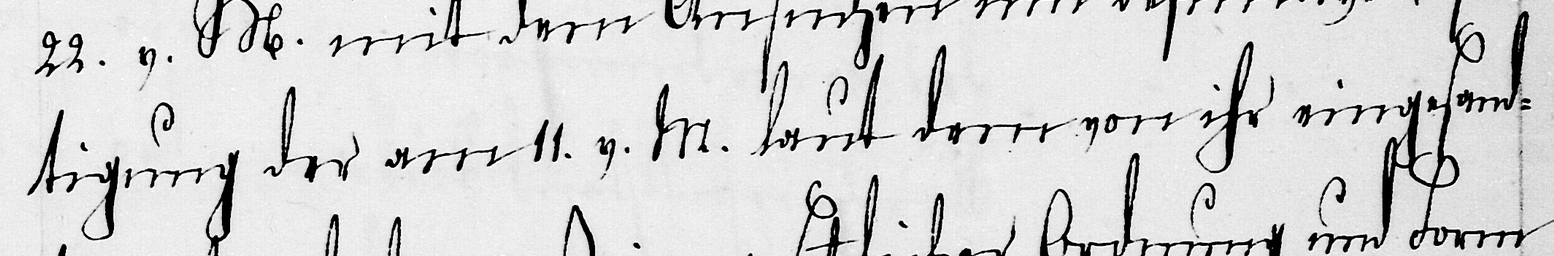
tigung der am 11. v. M. laut dem von ihr eingesand¬
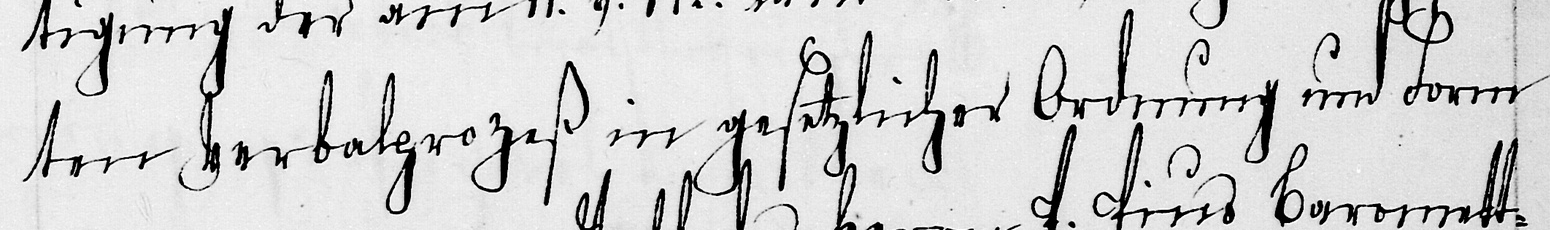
ten Verbalprozeß in gesetzlicher Ordnung und Form
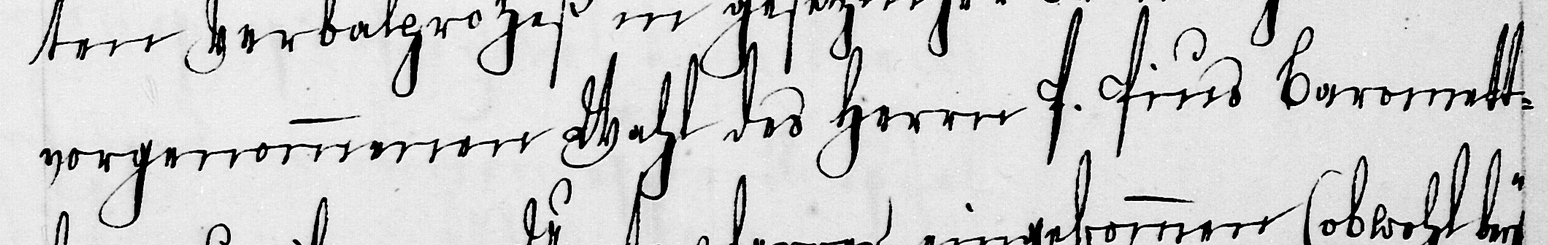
vorgenommenen Wahl des Herrn P. Pius Baromet¬
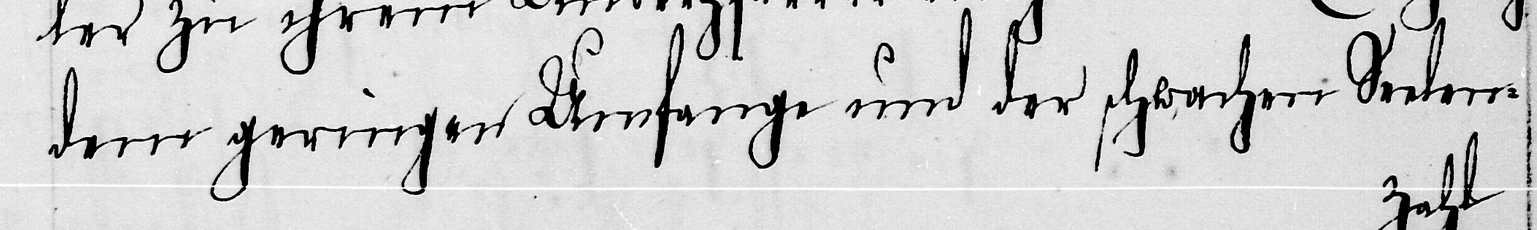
dem geringen Umfange und der schwachen Seelen-
